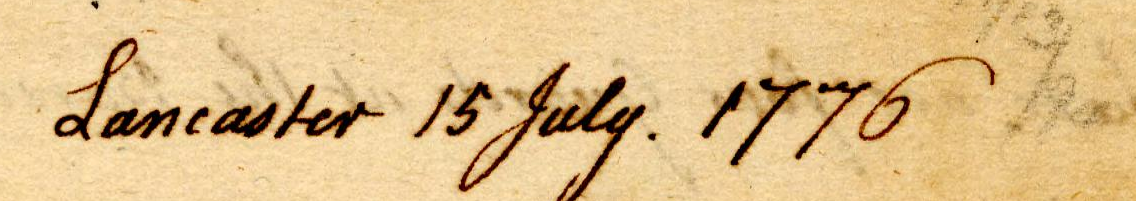Lancaster 15 July. 1776
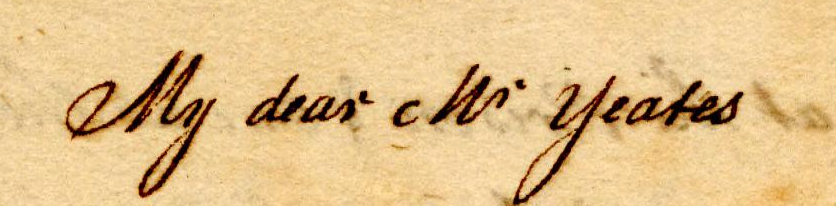My dear M^r Yeates
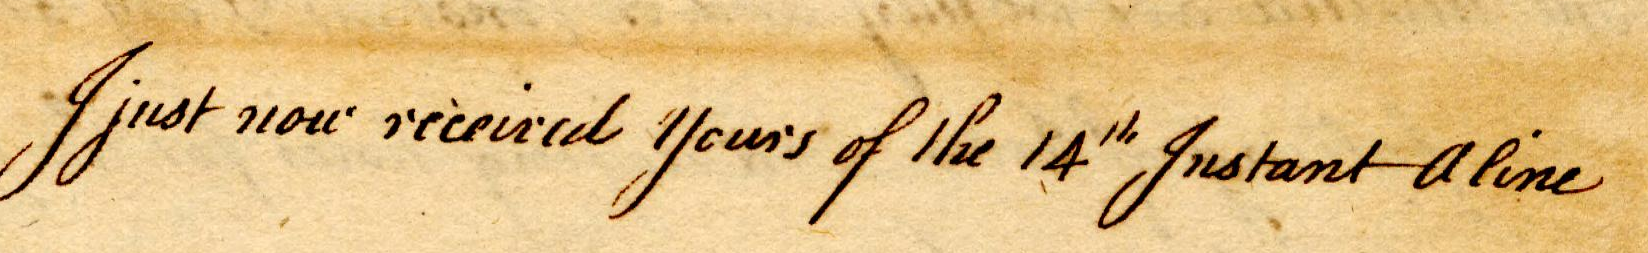I just now received yours of the 14^th Instant A line
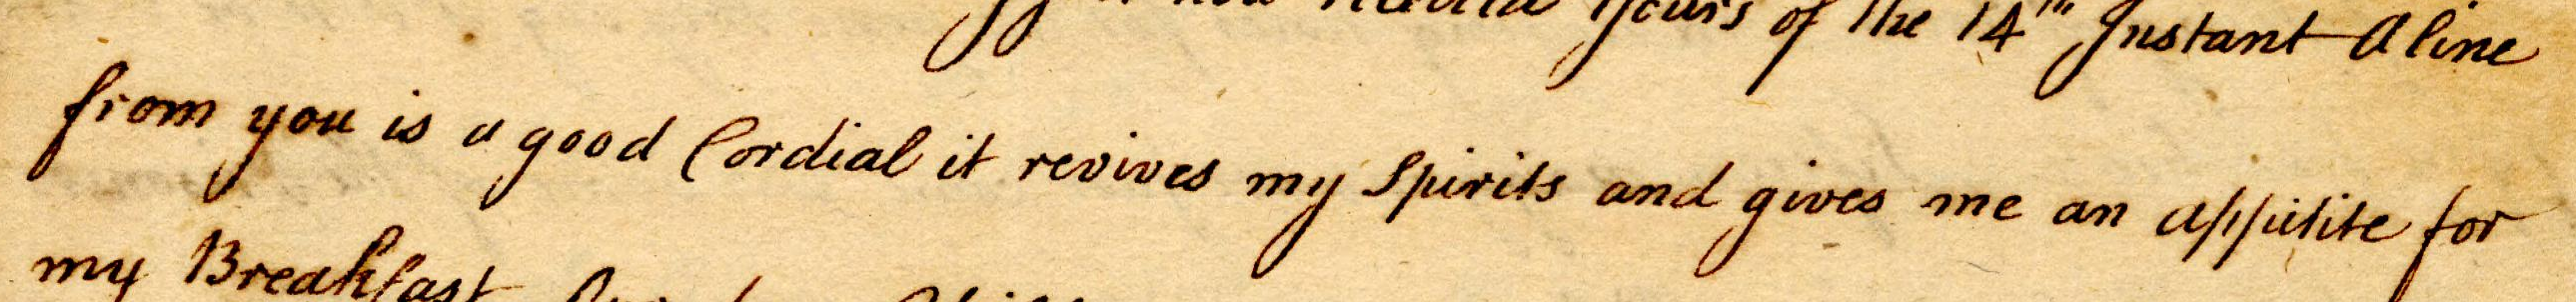from you is a good Cordial it revives my Spirits and gives me an appitite for
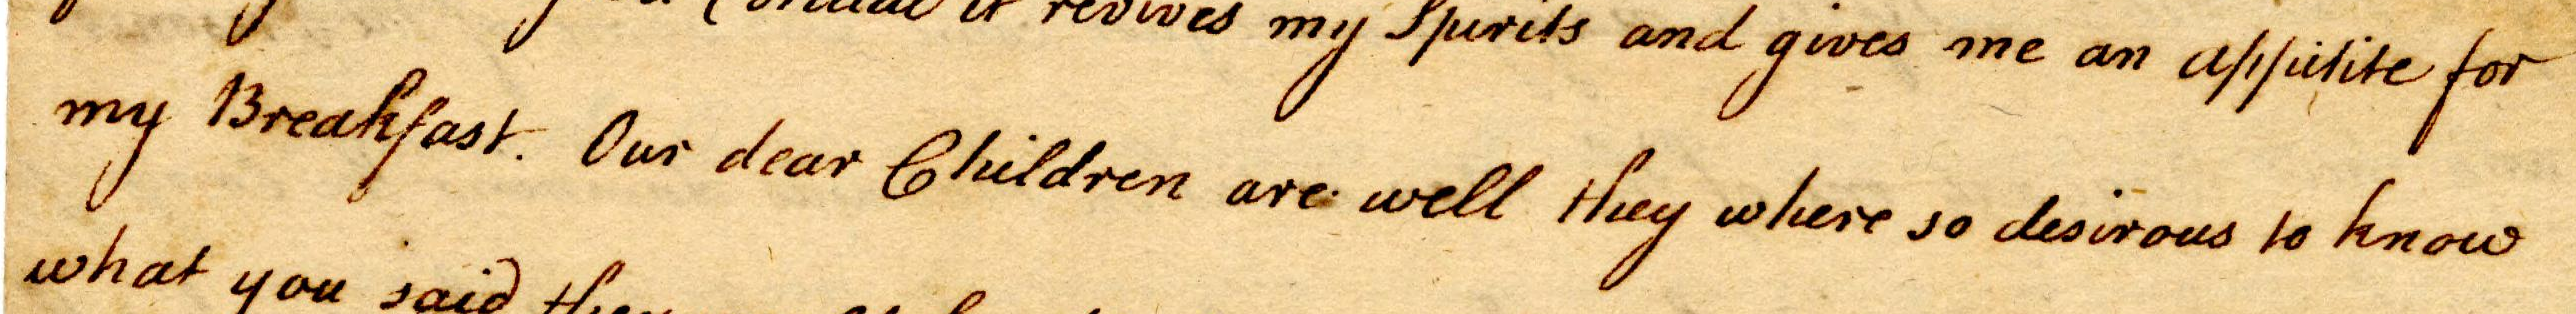my Breakfast. Our dear Children are well they where so desirous to know
